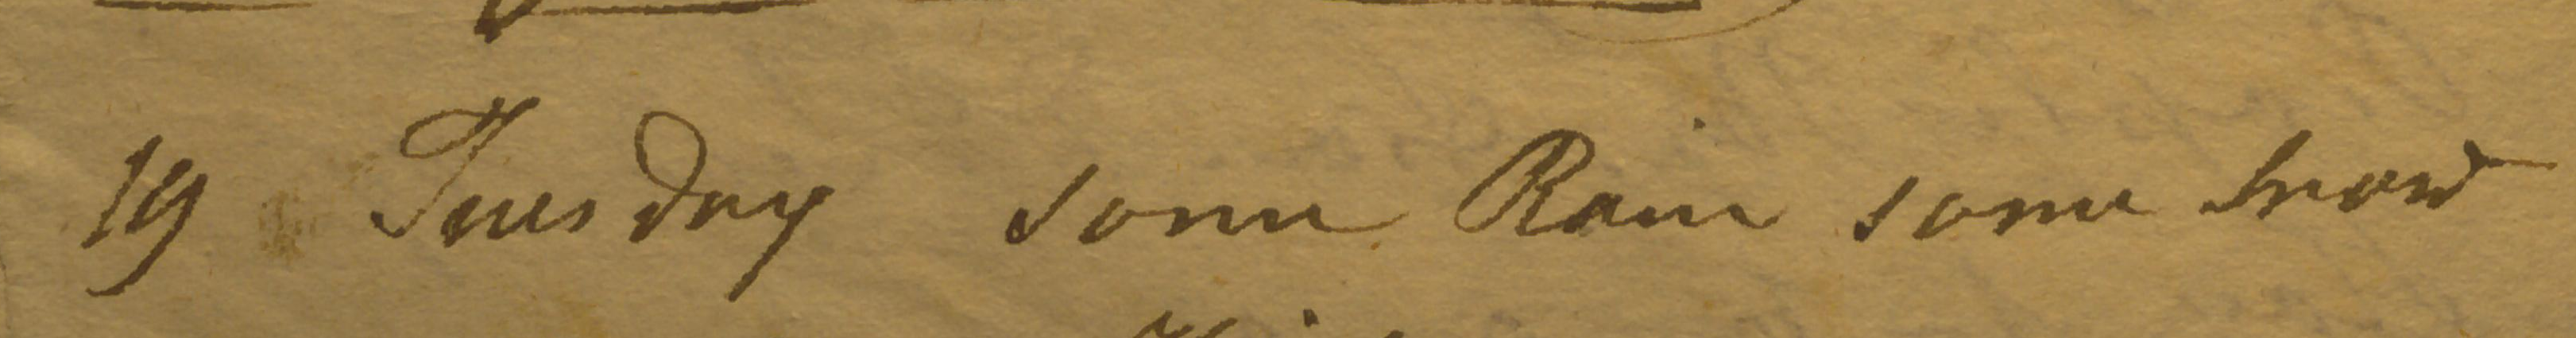19 Tuesday some Rain some snow
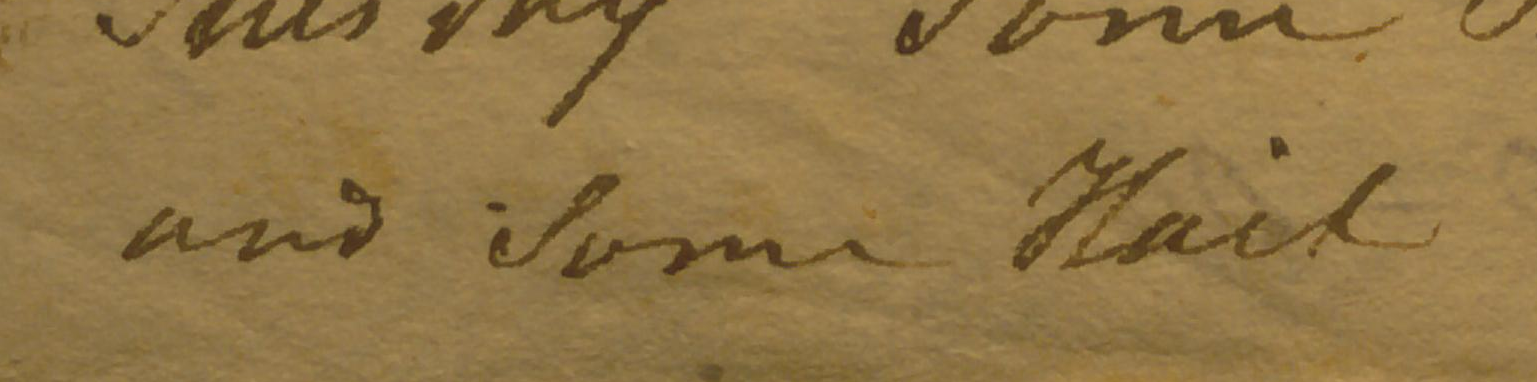and some Hail
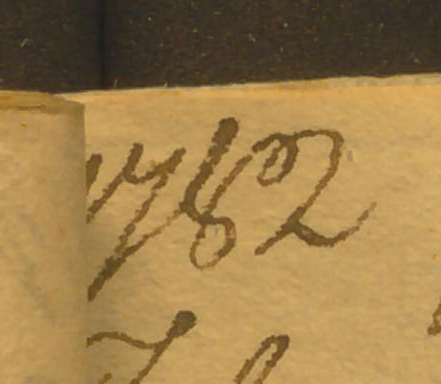1782
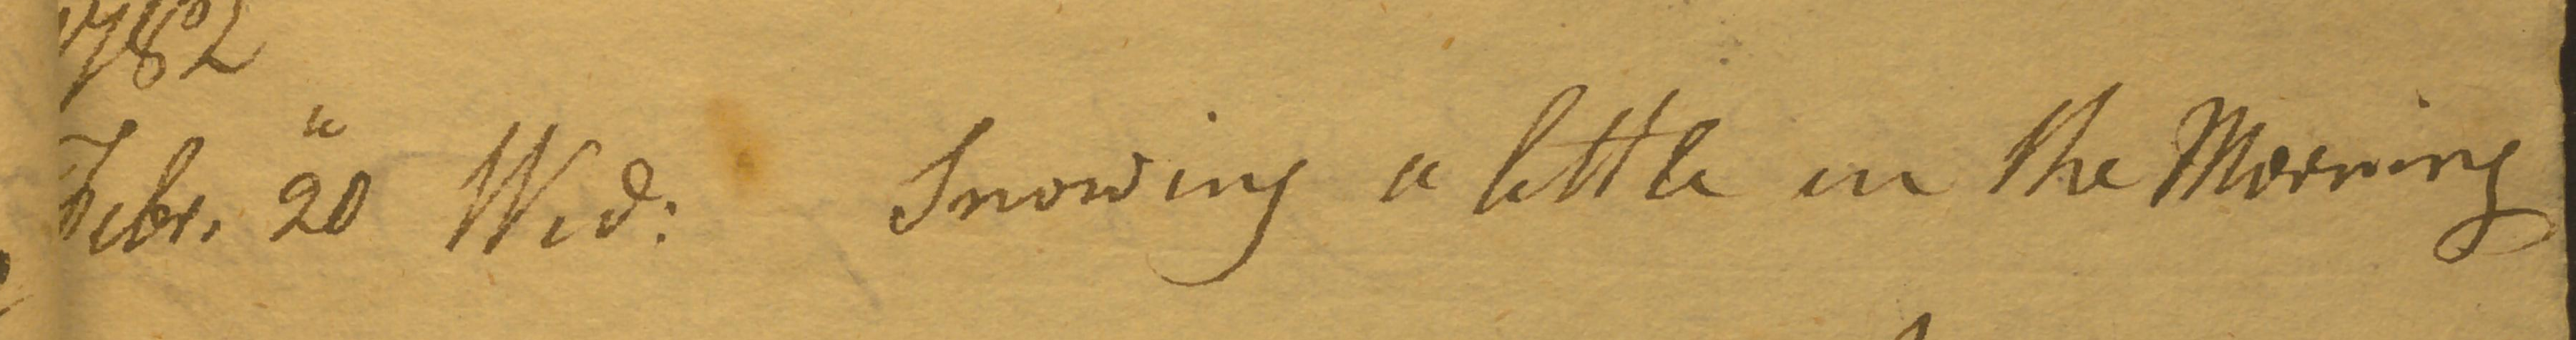Febr. 20^h Wed. Snowing a little in the Morning
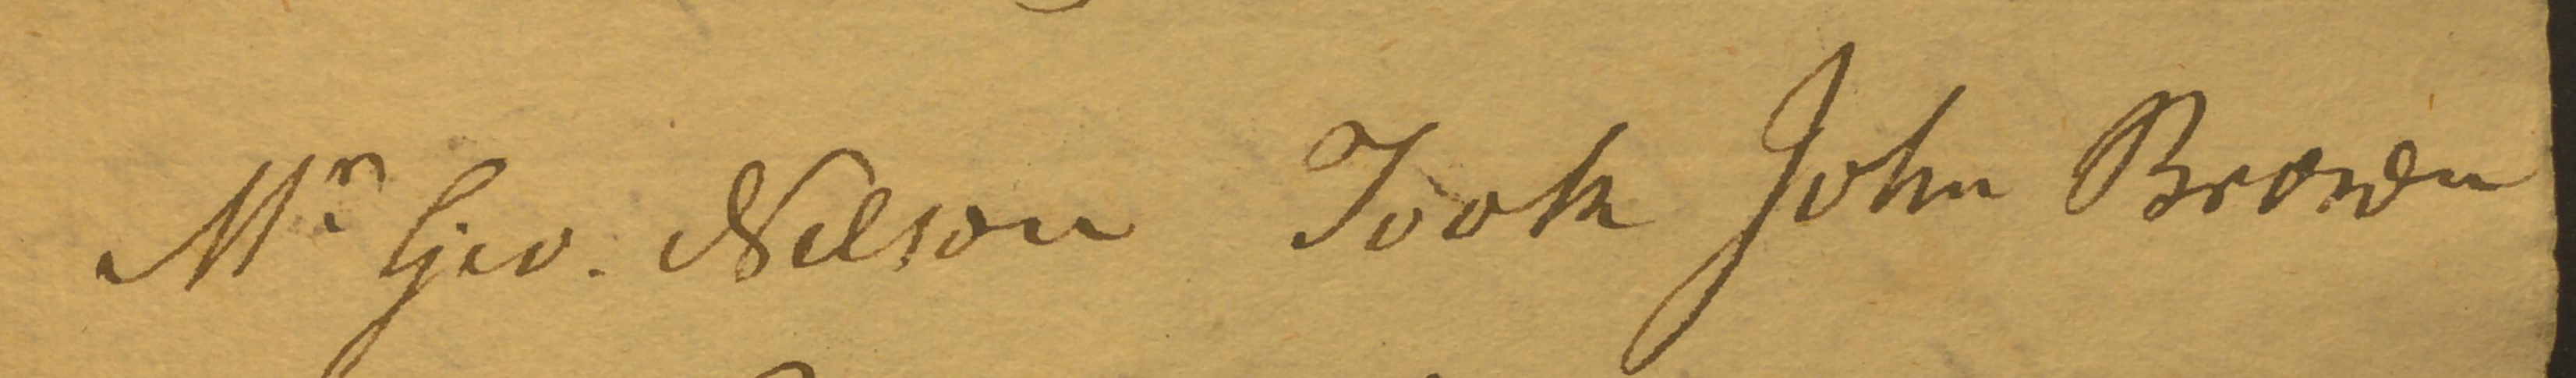M^r. Geo. Nelson Took John Brown
